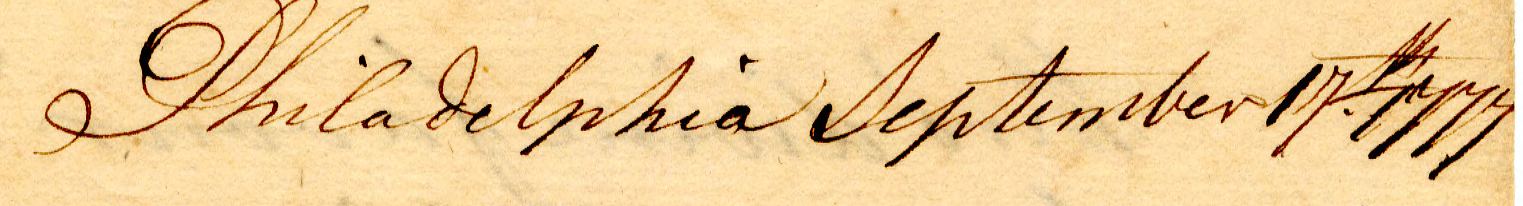Philadelphia September 17^th 1777
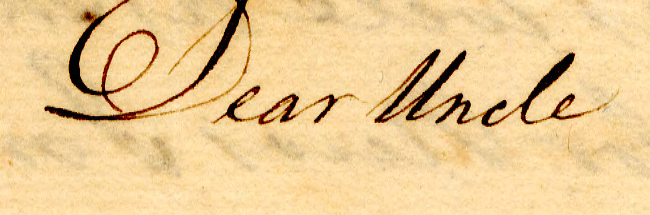Dear Uncle
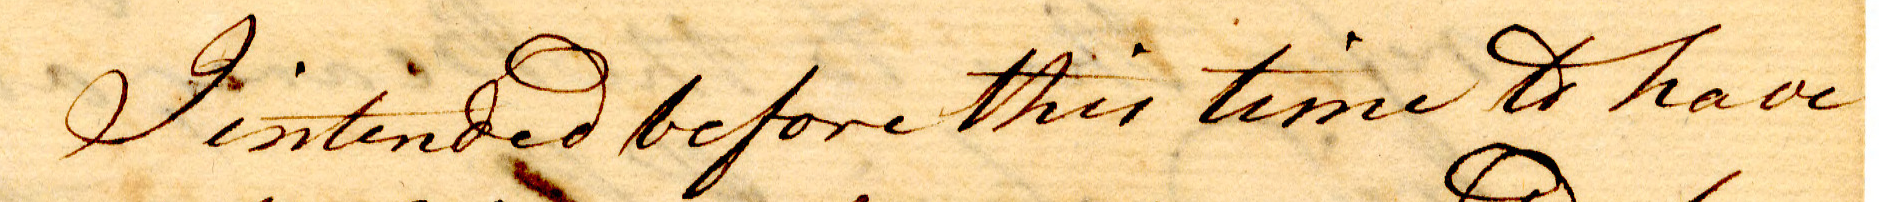I intended before this time to have
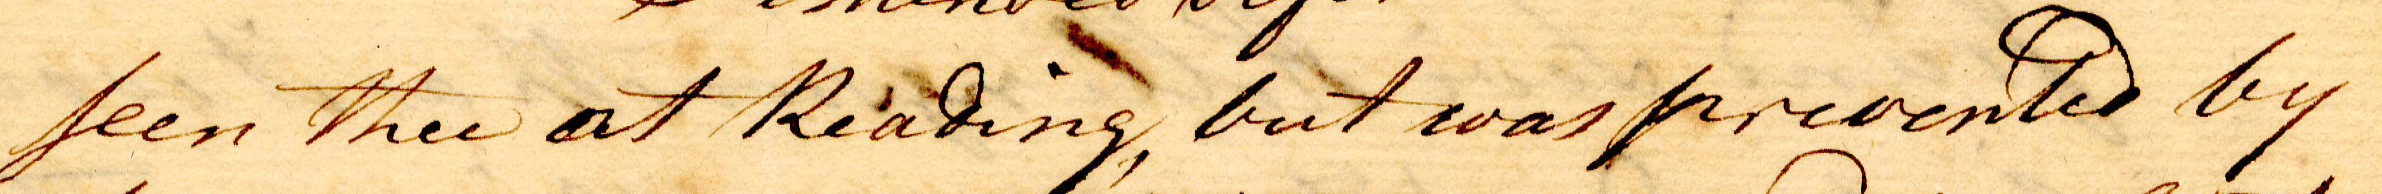seen thee at Reading, but was prevented by
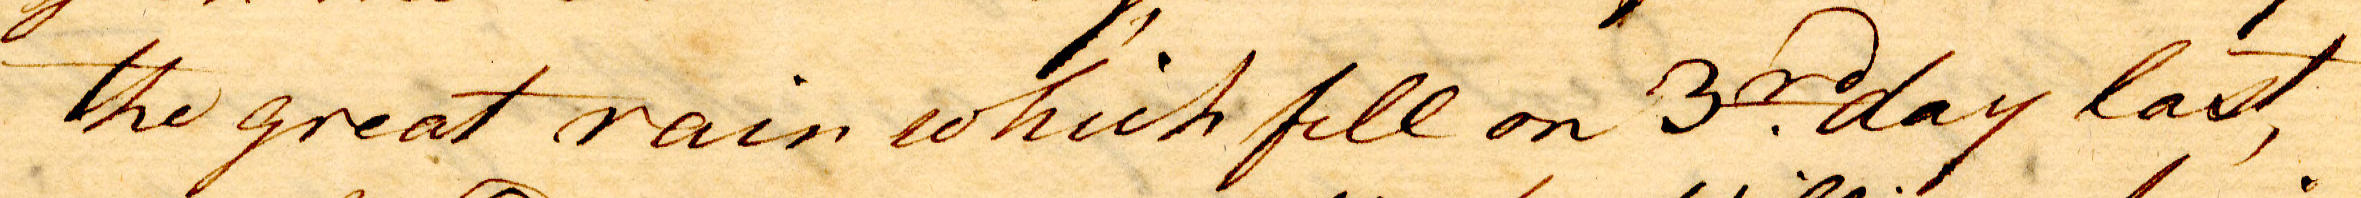the great rain which fell on 3^rd. day last,
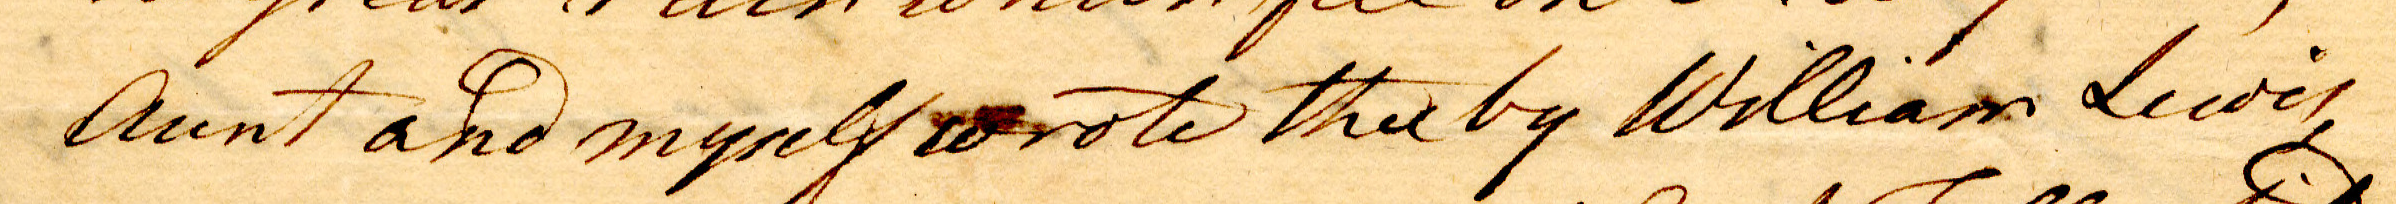Aunt and myself wrote thee by William Lewis,
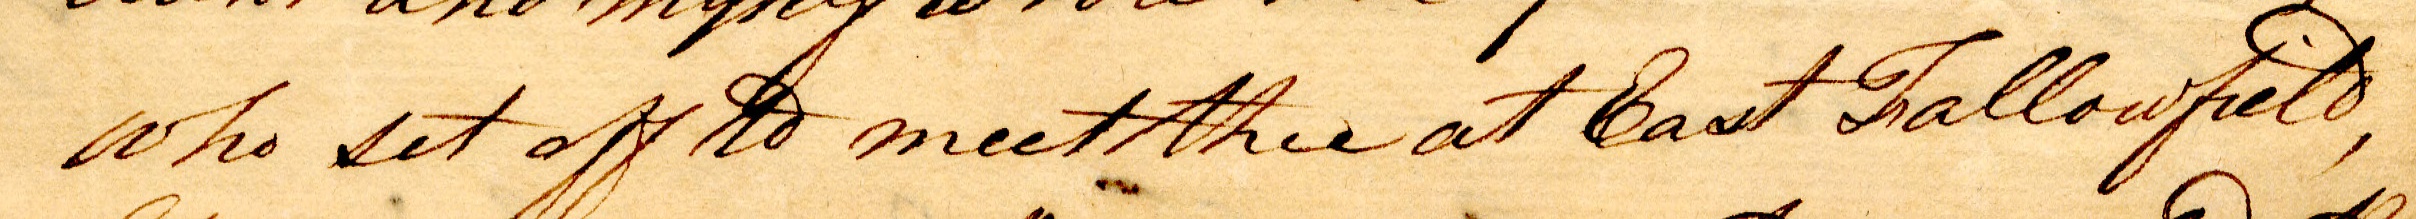who set off to meet thee at East Fallowfield,
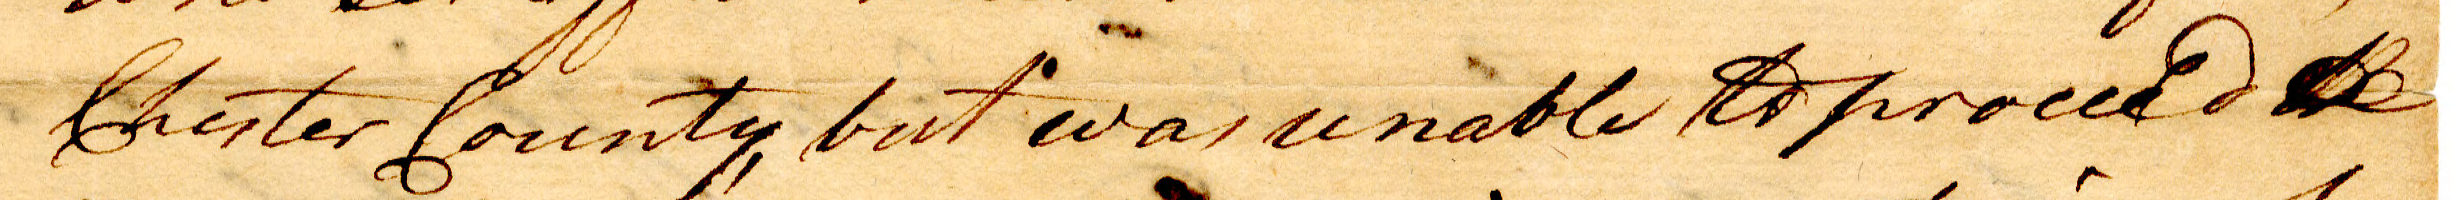Chester County, but was unable to proceed [__]
